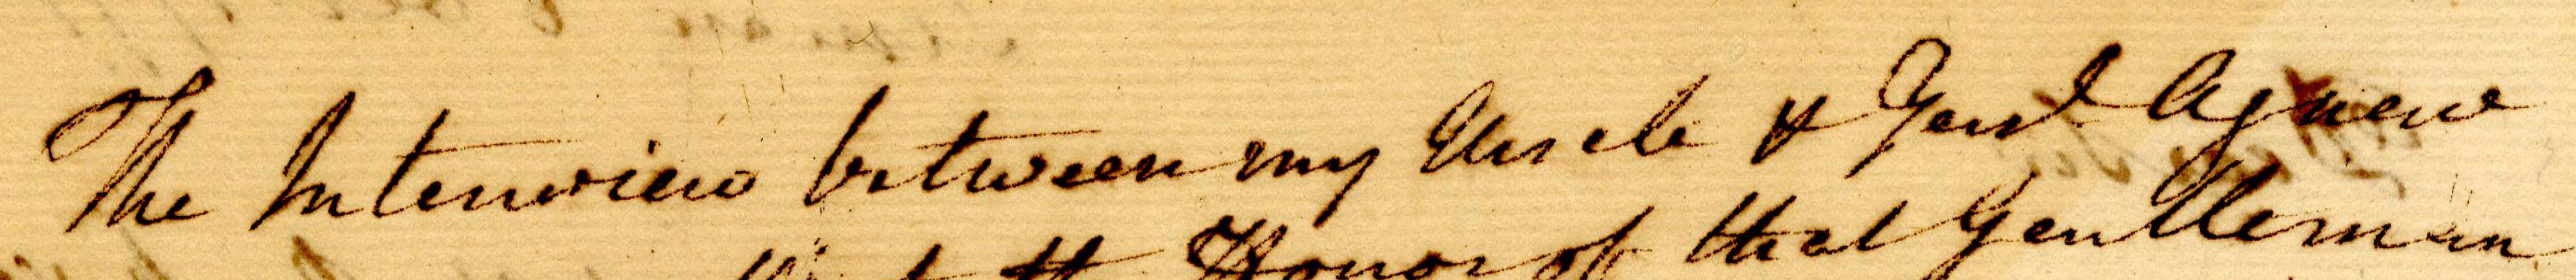The Interview between my Uncle & Gen^l Agaence
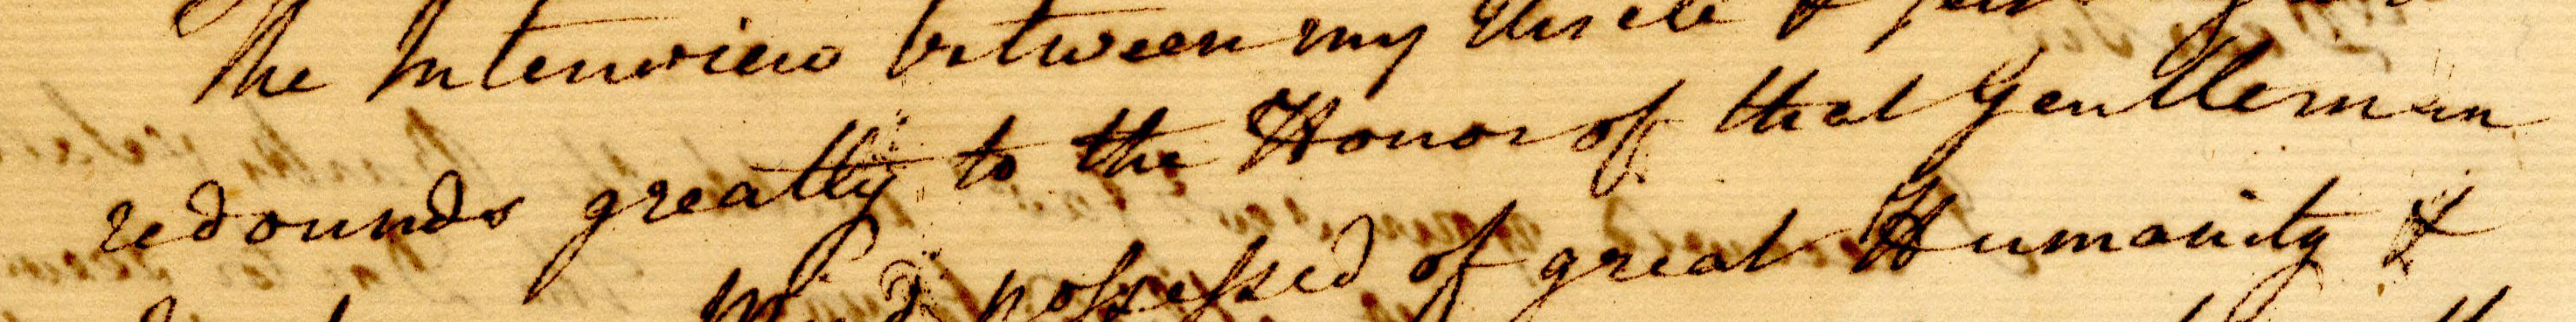redounds greatly to the Honor of that Gentleman
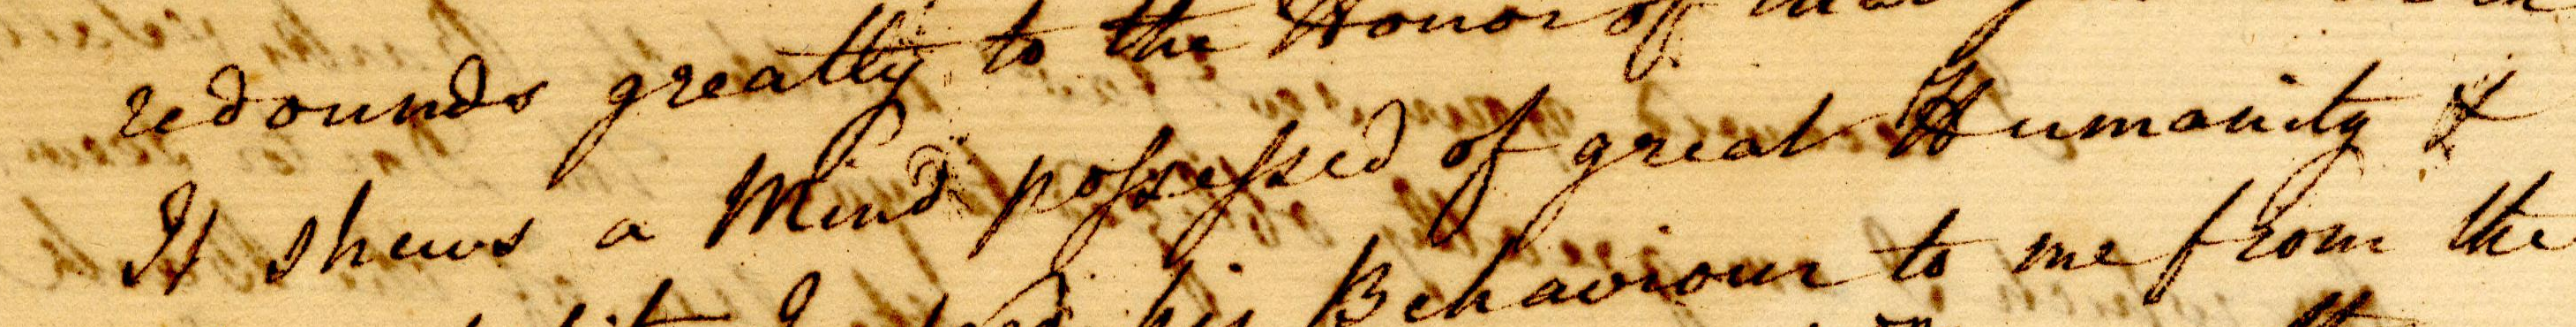It shews a Mind possessed of great Humanity &
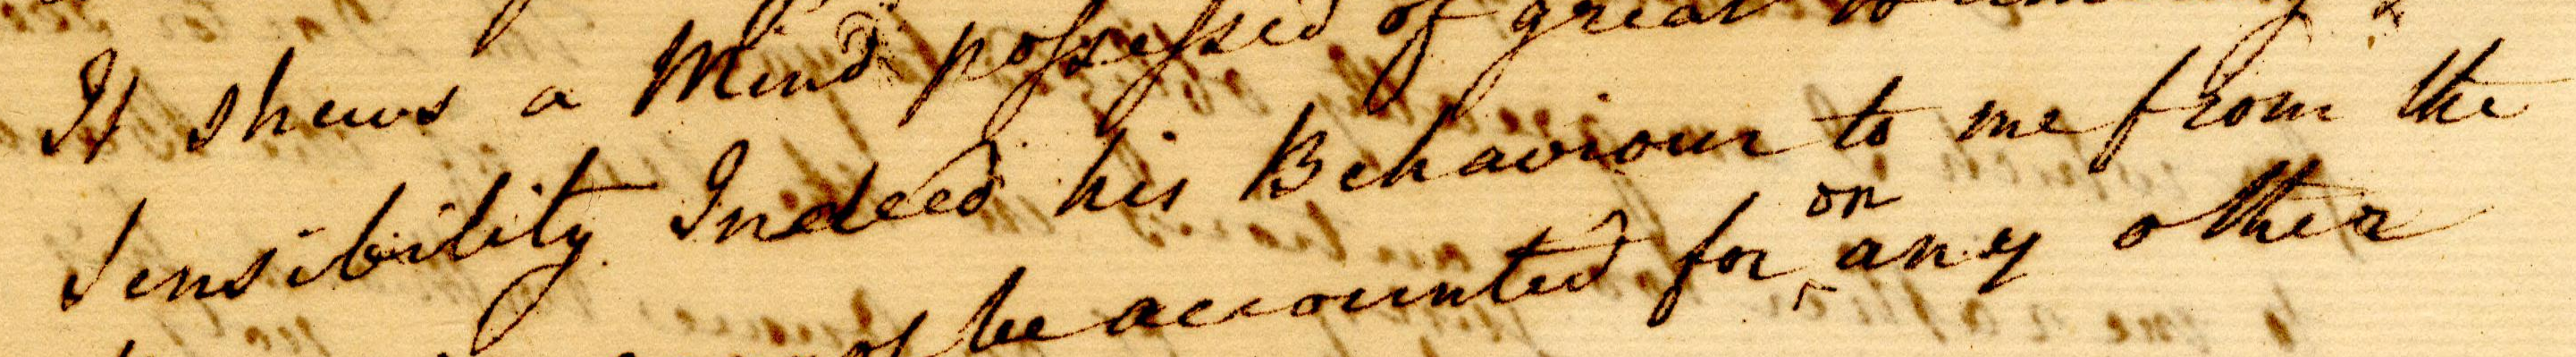Sensibility. Indeed his Behaviour to me from the
